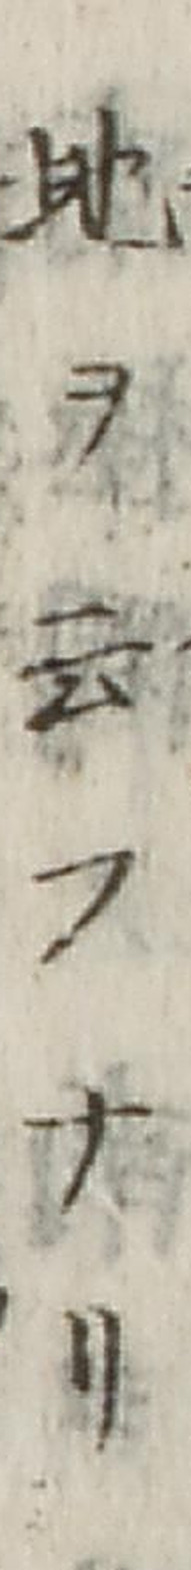地ヲ云フナリ
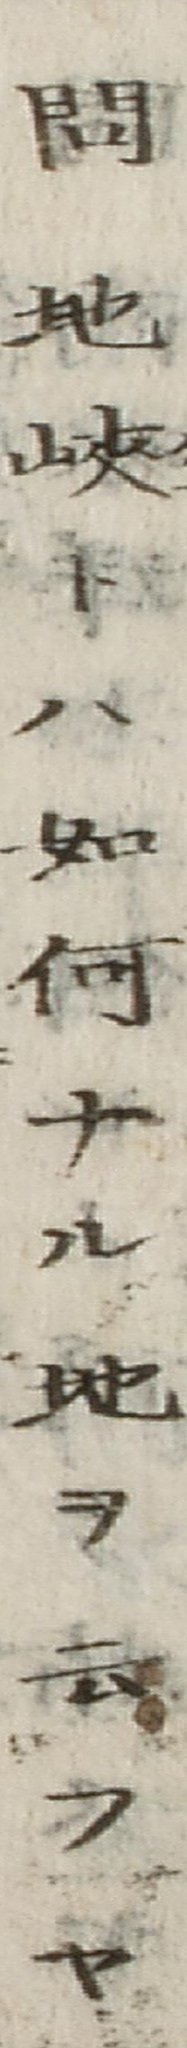問地峡トハ如何ナル地ヲ云フヤ
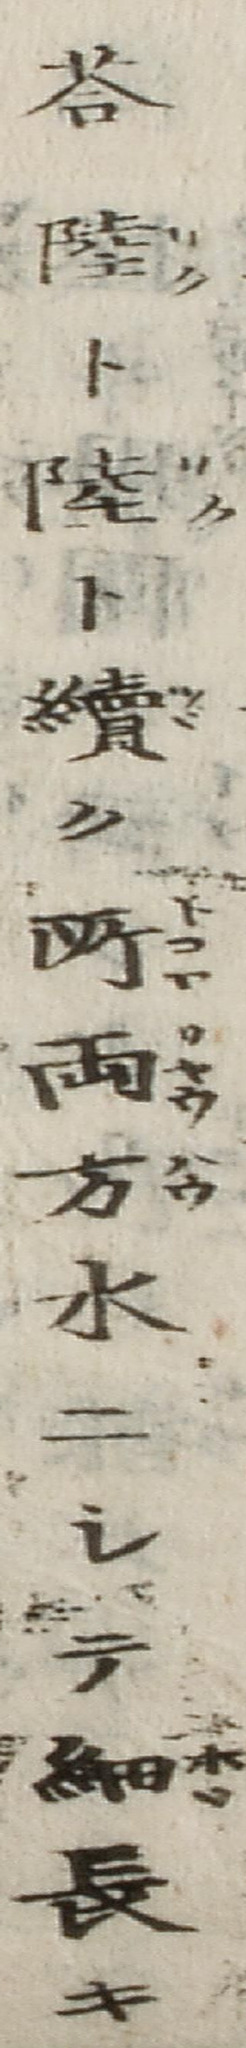答陸ト陸ト續ク所両方水ニシテ細長キ
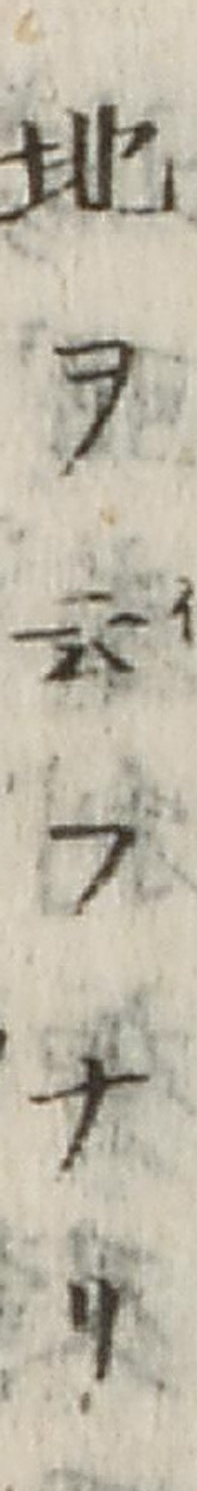地ヲ云フナリ
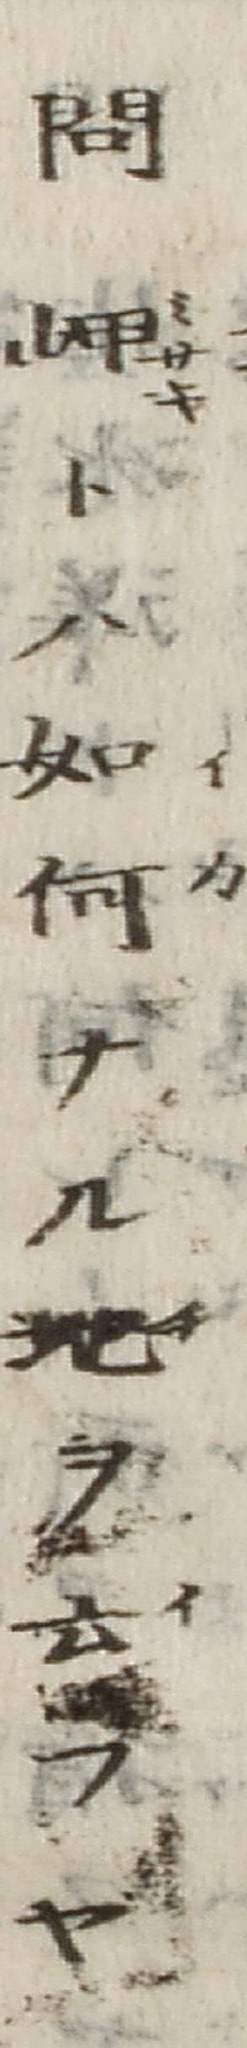問岬トハ如何ナル地ヲ云フヤ
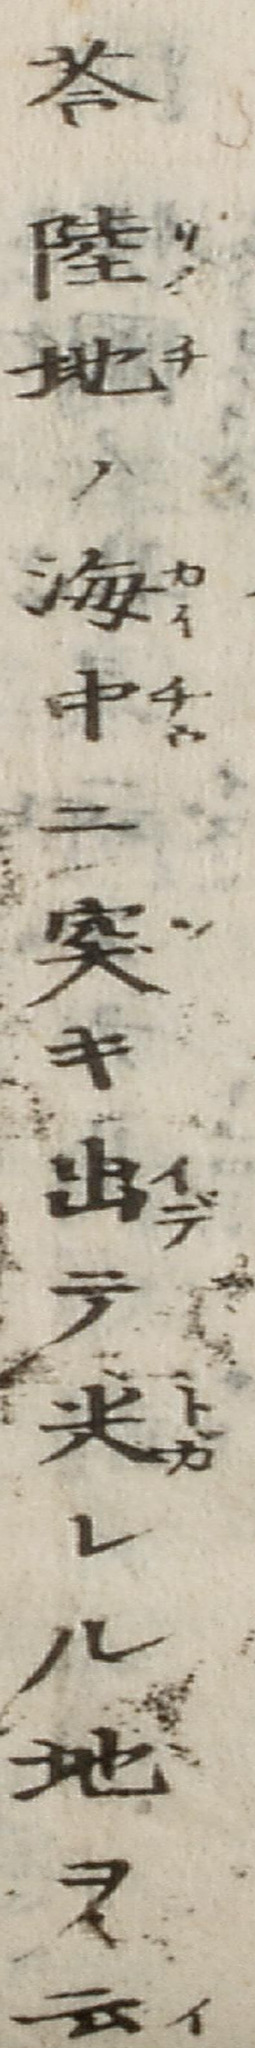答陸地ノ海中ニ突キ出テ尖レル地ヲ云
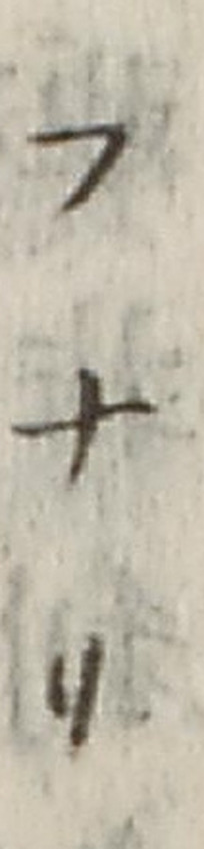フナリ
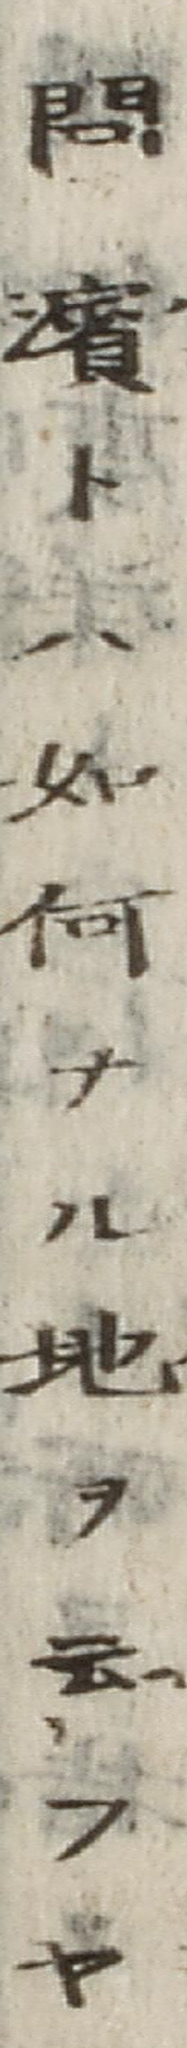問濱トハ如何ナル地ヲ云フヤ
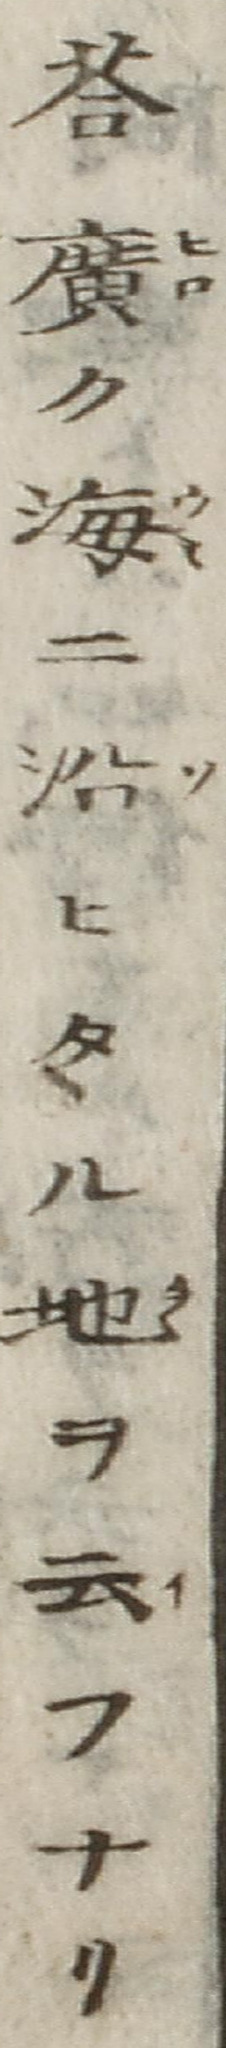答廣ク海ニ沿ヒタル地ヲ云フナリ
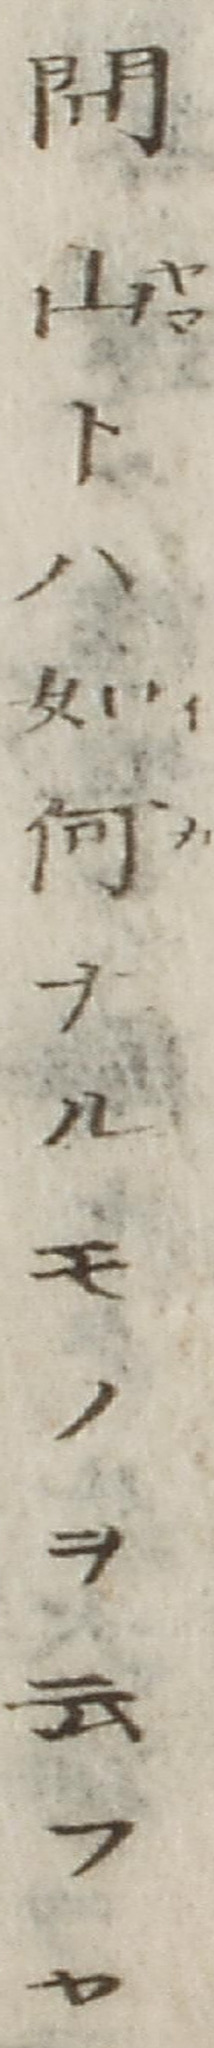問山トハ如何ナルモノヲ云フヤ
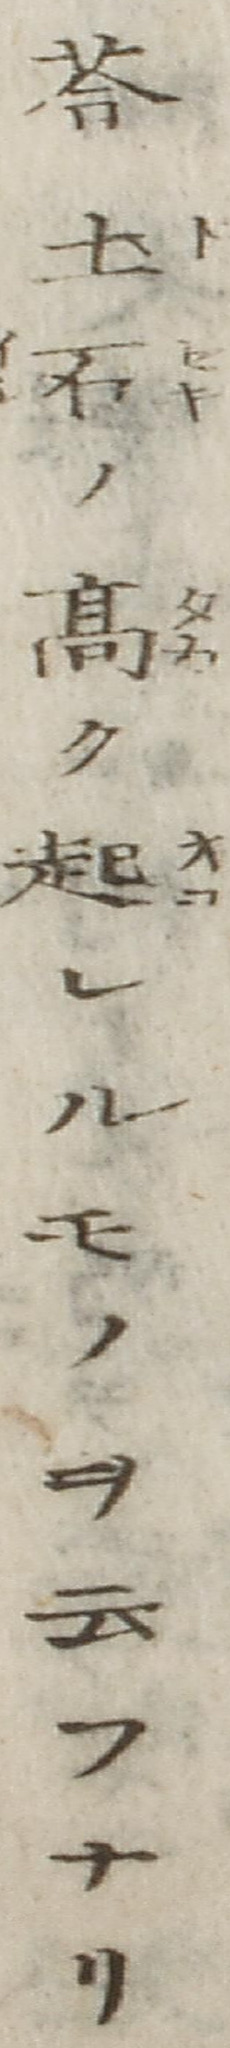答土石ノ高ク起レルモノヲ云フナリ
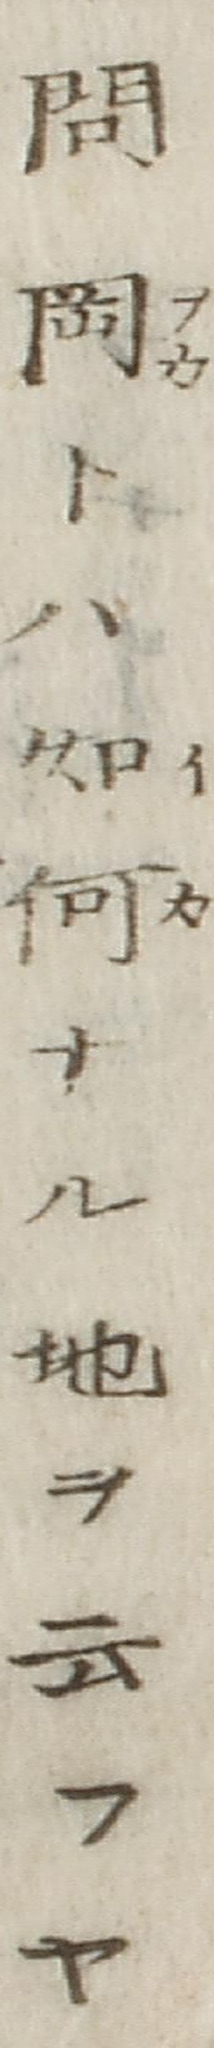問岬トハ如何ナル地ヲ云フヤ
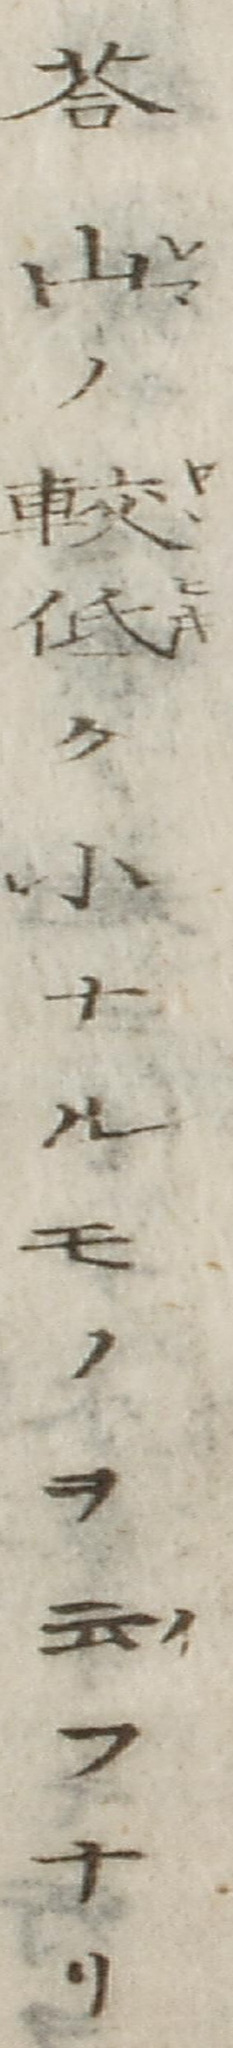答山ノ較低ク小ナルモノヲ云フナリ
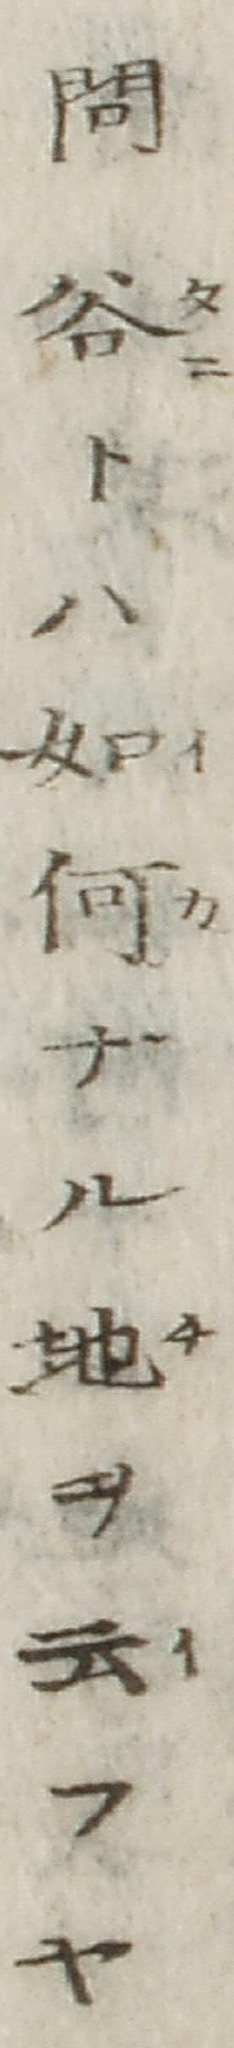問岬トハ如何ナル地ヲ云フヤ
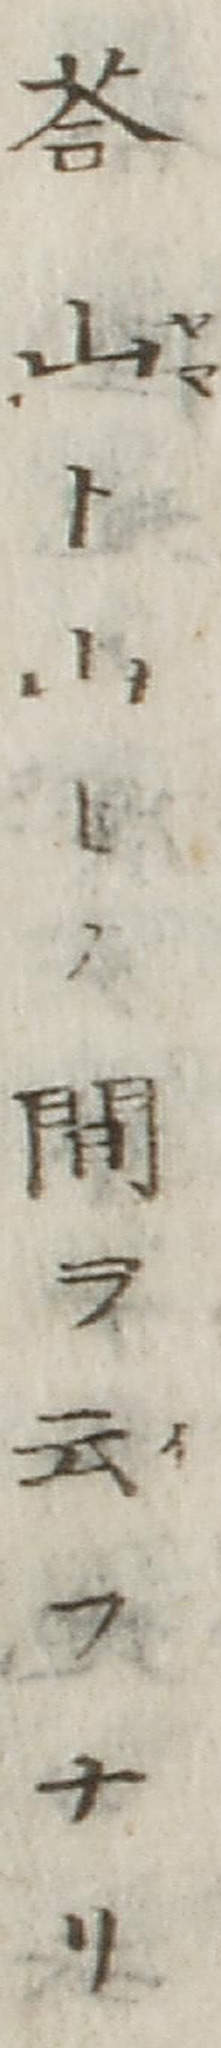答山ト山トノ間ヲ云フナリ
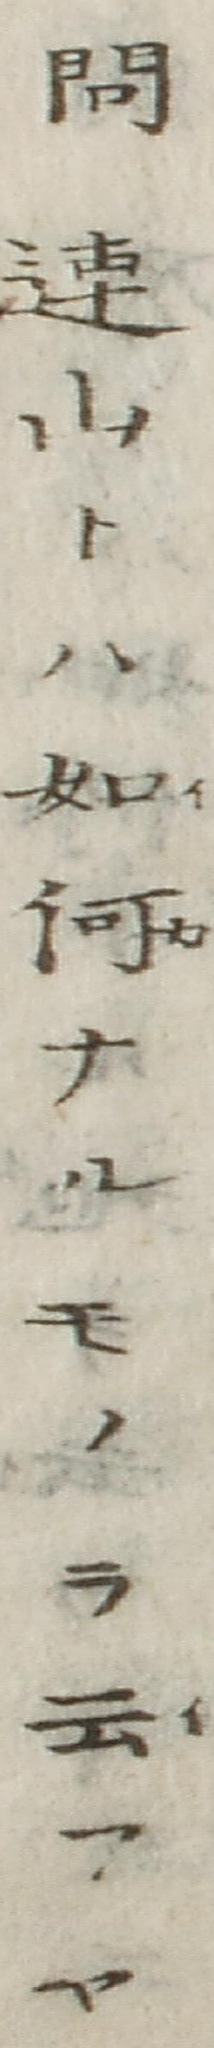問連山トハ如何ナルモノヲ云フヤ
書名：地球儀問答　全
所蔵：東京大学地震研究所図書室 Earthquake Research Institute Library, The University of Tokyo, JAPAN
